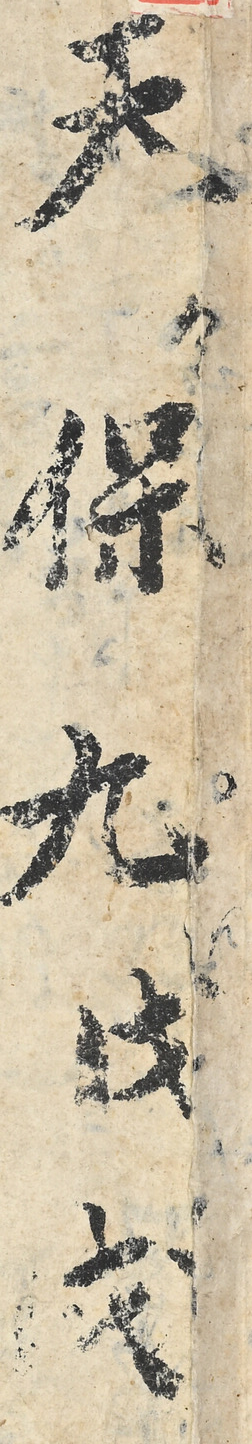天保九戊戌
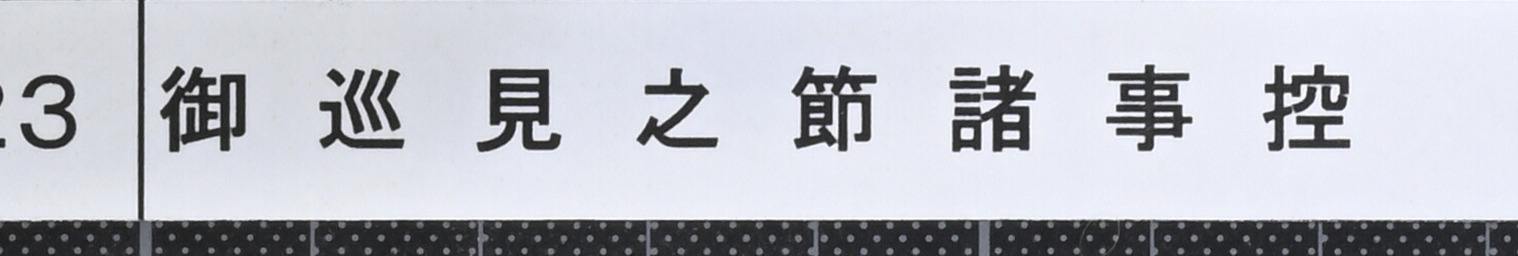御巡見之節諸事控
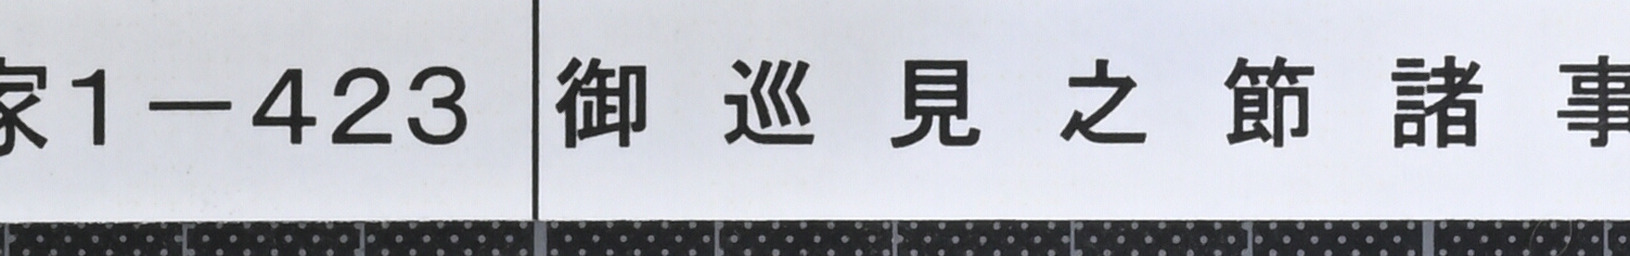御巡見之節諸事控
